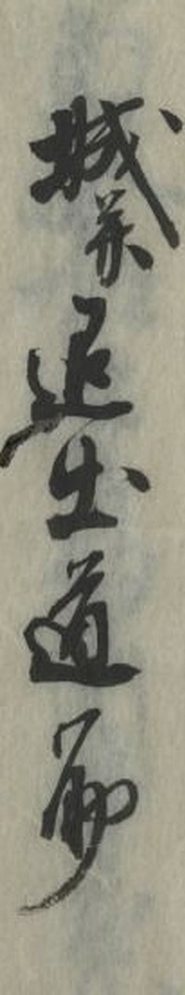城幷退出道筋
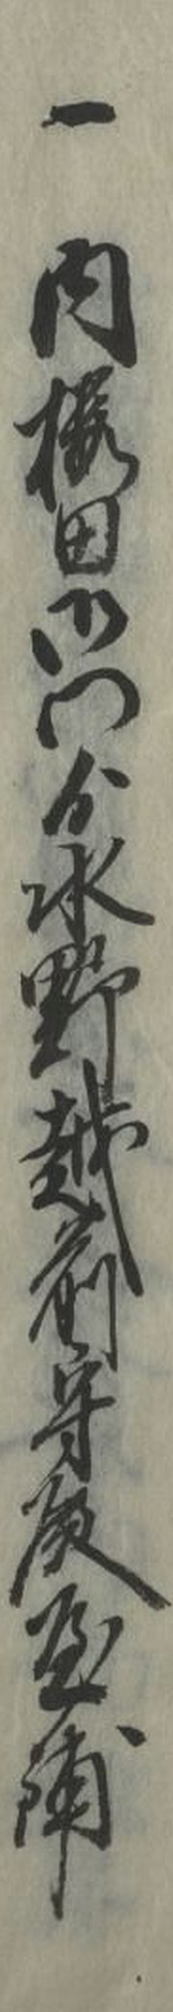一内桜田御門ゟ水野越前守殿屋鋪
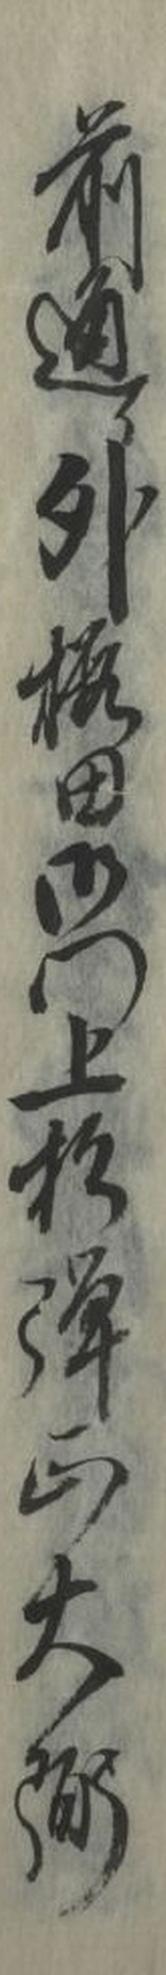前通り外桜田御門上杉弾正大弼

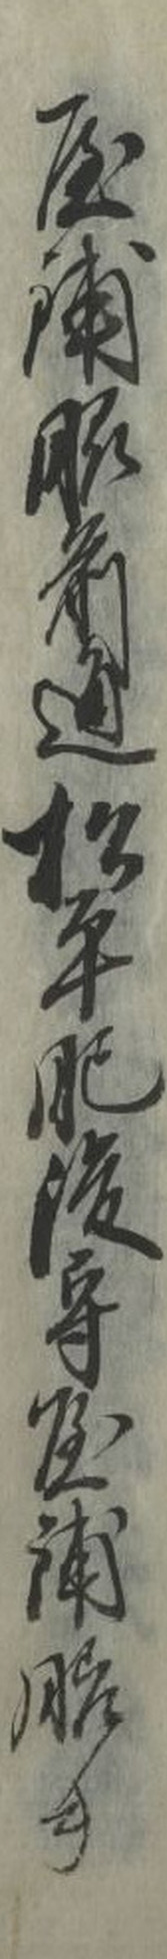屋鋪脇前道松平肥後守屋鋪脇を
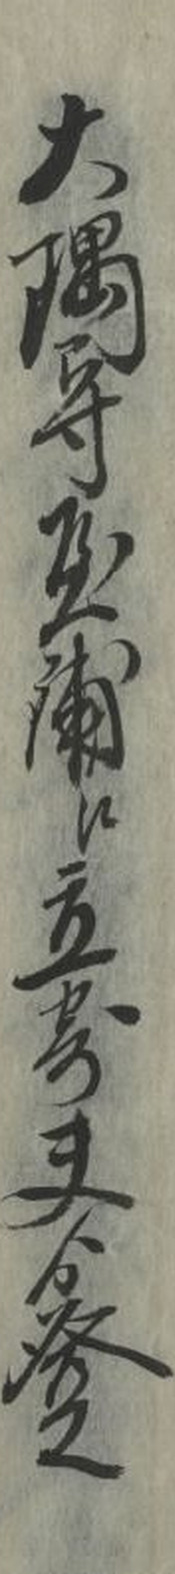大隅守屋鋪え立寄夫ゟ登
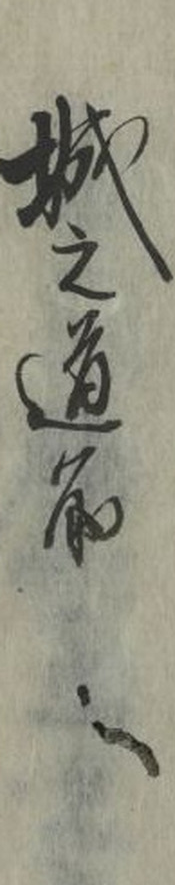城之道筋
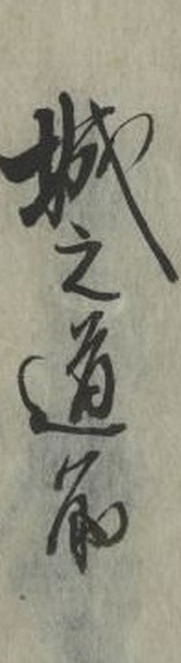城之道筋
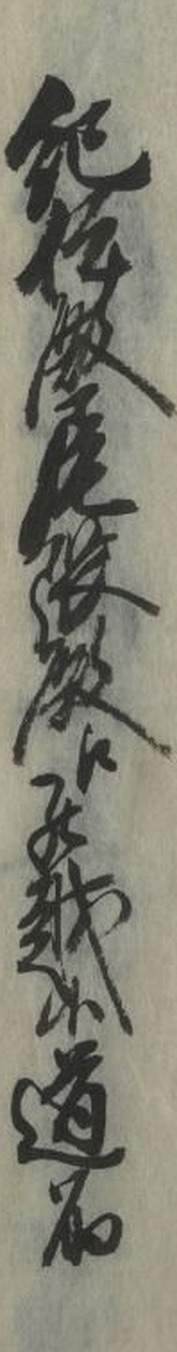紀伊殿尾張殿え罷越候道筋
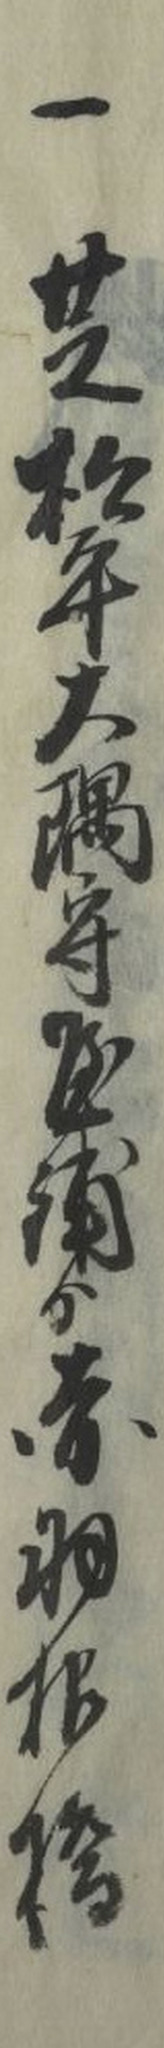一芝松平大隅守屋鋪ゟ赤羽根橋
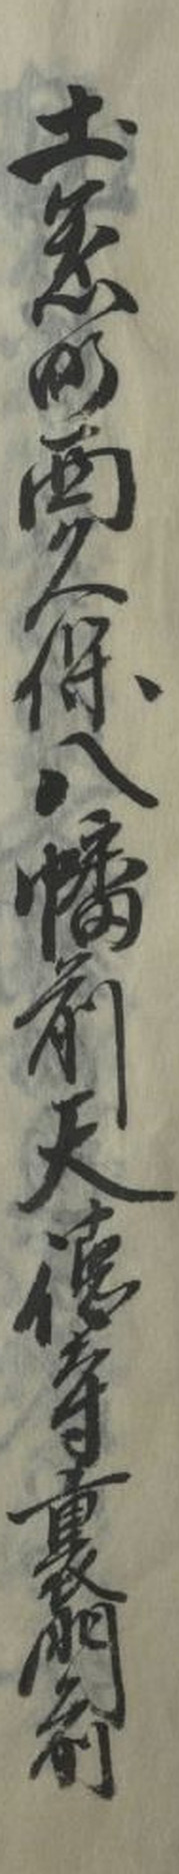土器町西久保八幡前天徳寺裏門前
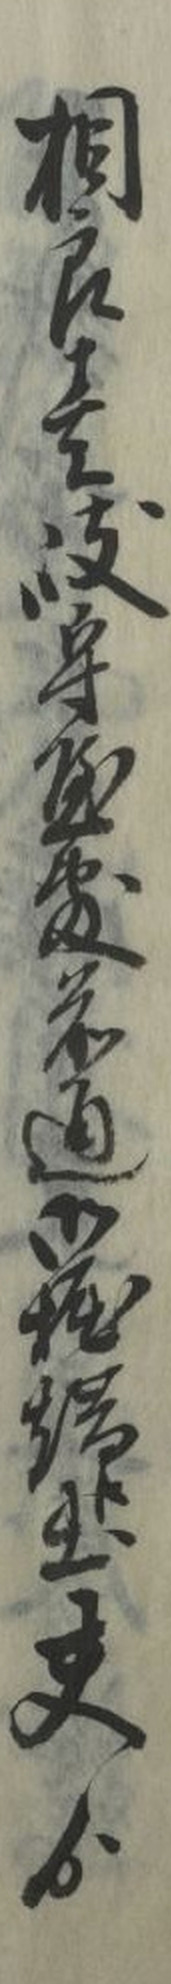相良壱岐守屋敷前道御堀端え出夫ゟ
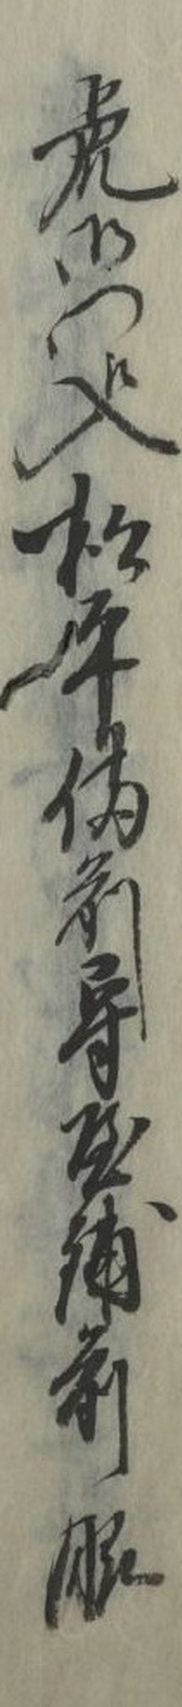虎御門え入松平備前守屋鋪前脇
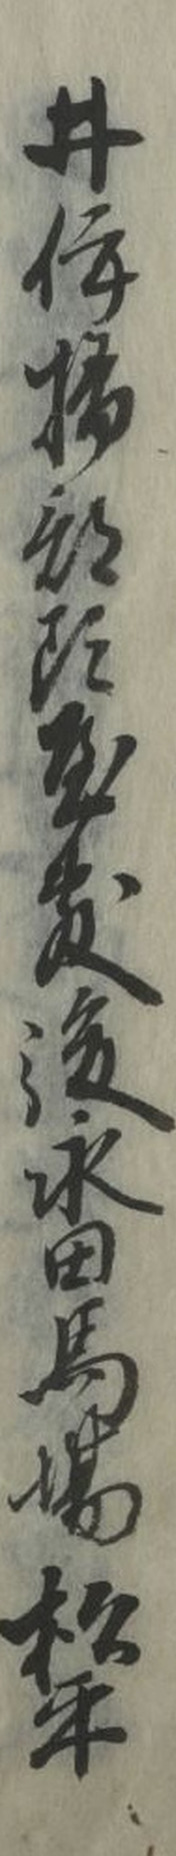井伊掃部頭屋敷後永田馬場松平
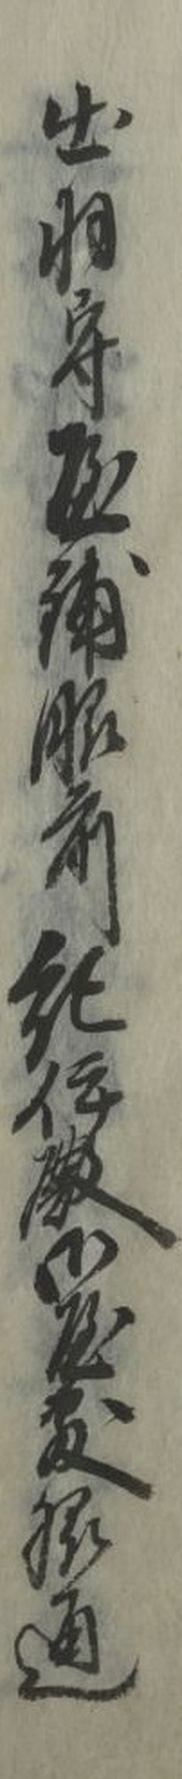出羽守屋鋪脇前紀伊殿御屋敷脇通

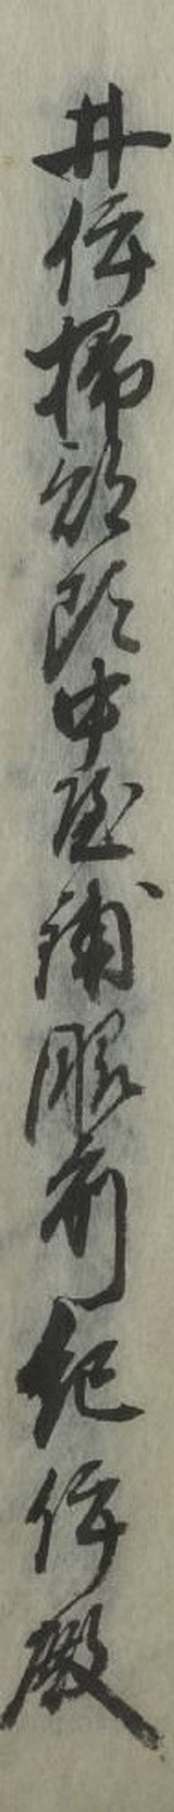井伊掃部頭中屋鋪脇前紀伊殿
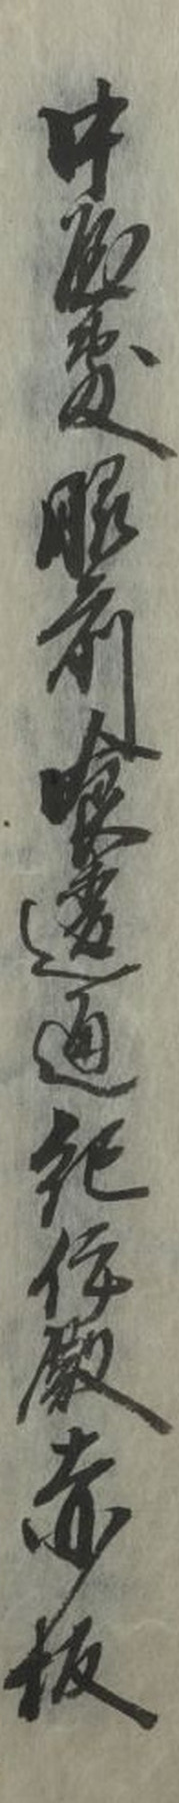中屋敷脇前喰違通紀伊殿赤坂
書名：天保三壬辰年・琉球人参府・弐朱吹立御触写
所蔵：University of the Ryukyus Library
